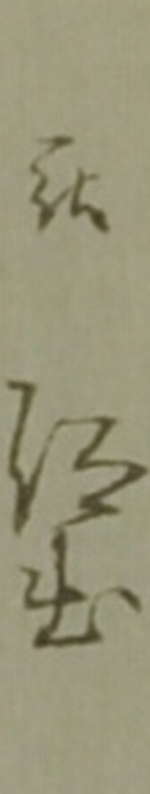被仰出
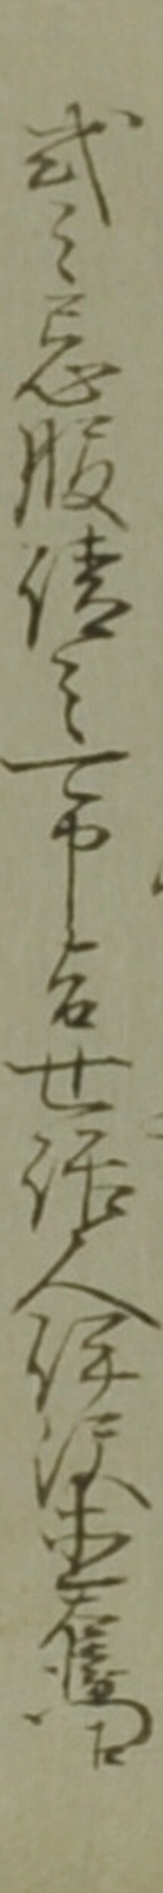式之忌服請之可申旨世話人伊沢直右衛門江
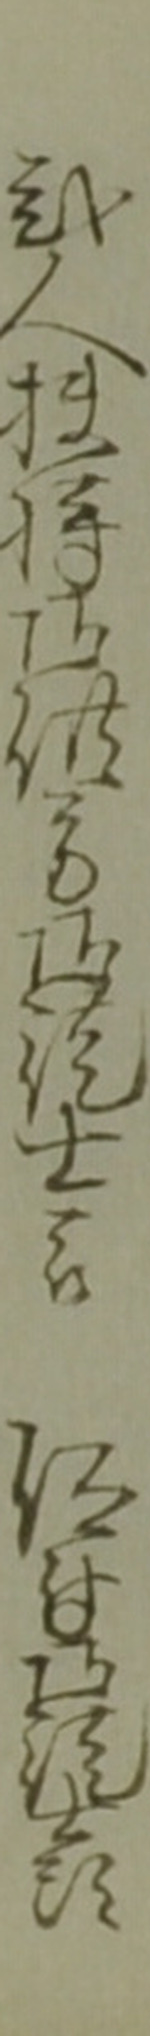弐人扶持御供方御徒士被仰付御徒士頭
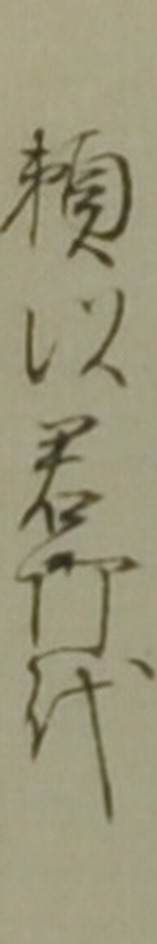頼以君御代
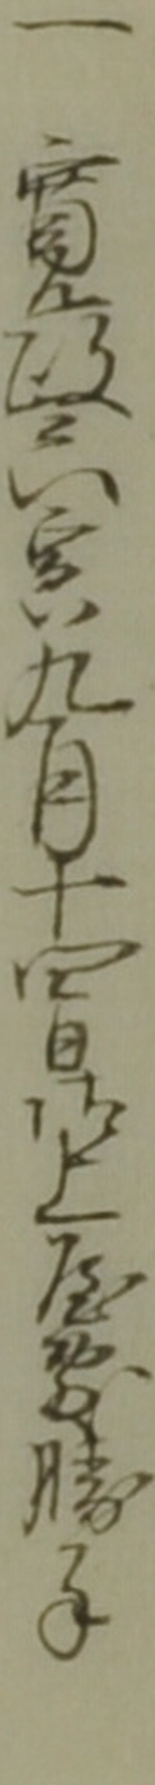一寛政六寅九月十四日御上屋敷勝手
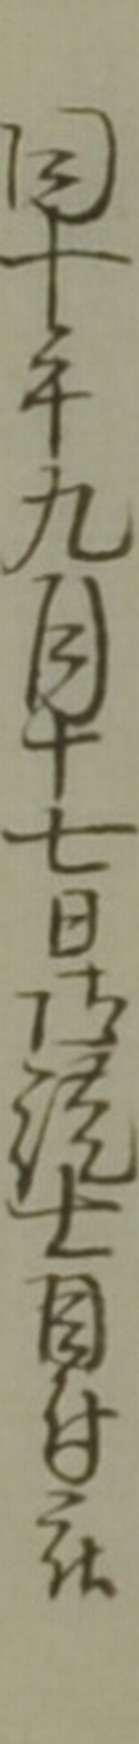一同十午九月十七日御徒士目付被
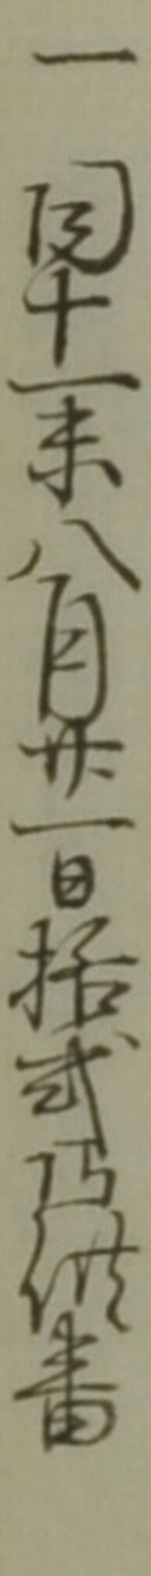一同十一未八月廿一日格式御供番
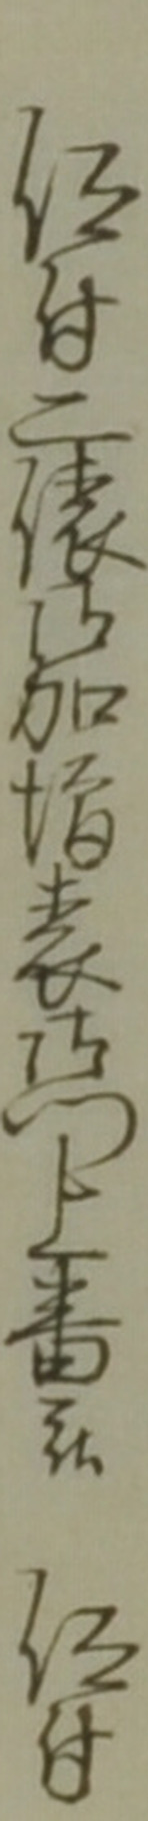仰付二俵御加増表御門上番被仰付
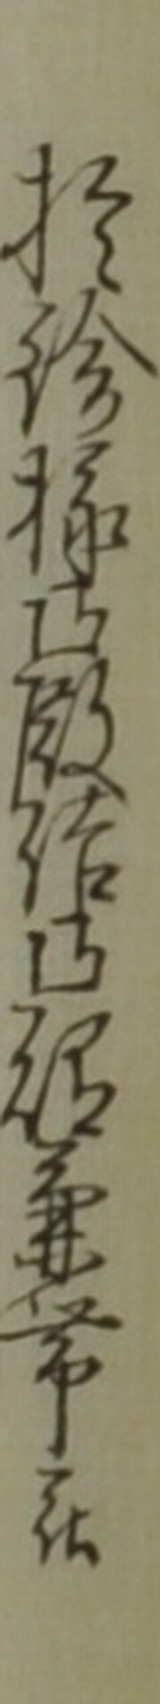於鉩様御殿詰御賄兼帯被
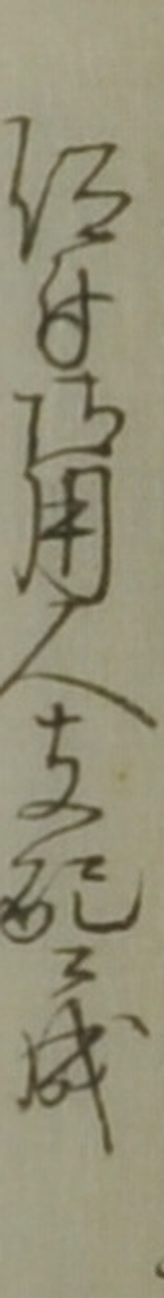仰付御用人支配ニ成
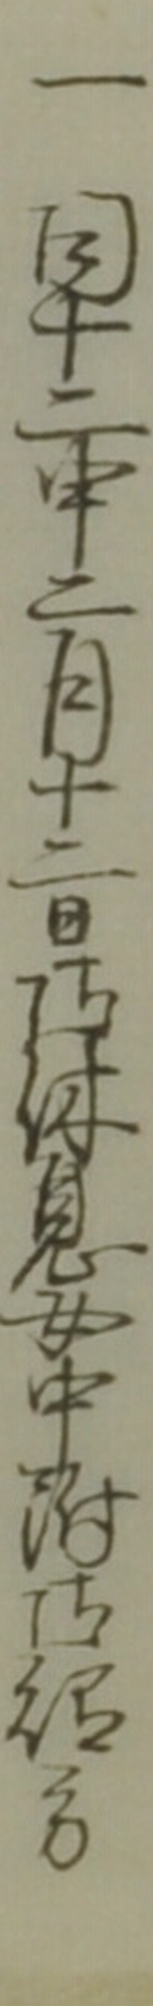一同十二申二月十二日御休息女中附御賄方
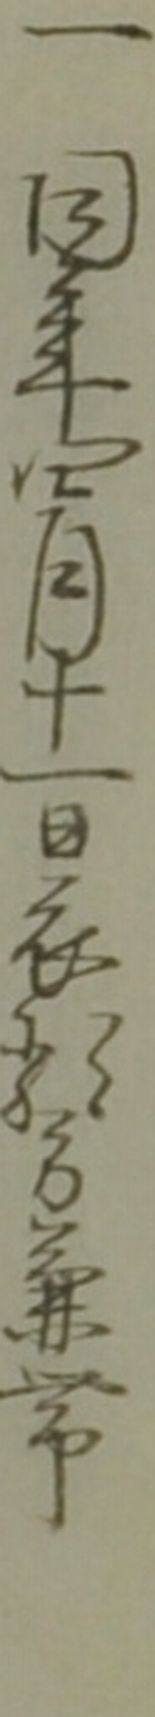一同年四月十一日衣類方兼帯
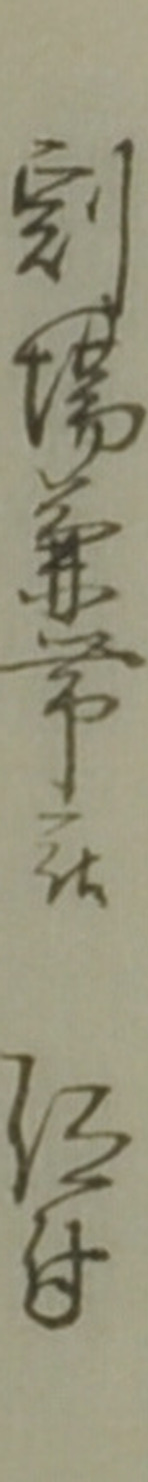割場兼帯被仰付
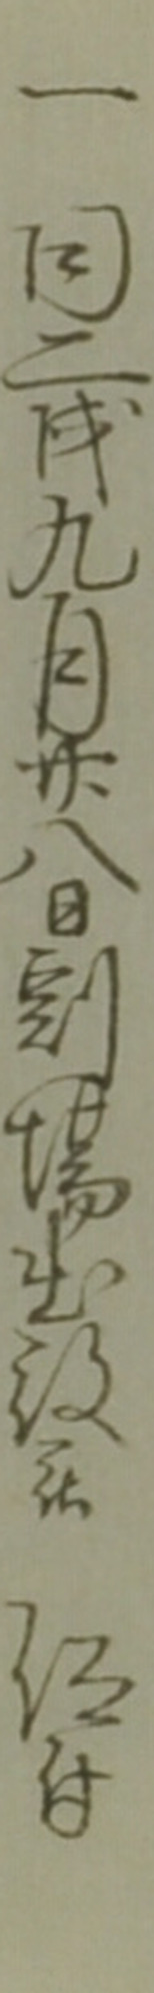一同二戌九月廿八日割場出役被仰付
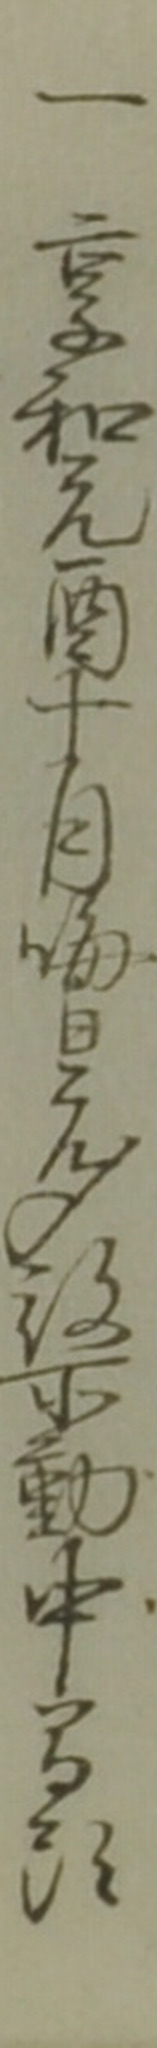一享和元酉十月晦日元〆役所勤仲間頭
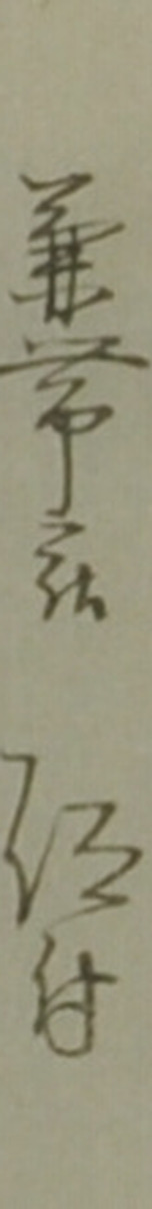兼帯被仰付
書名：無足諸士勤仕録（一）
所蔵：伊那市立高遠町図書館・合同会社AMANE
